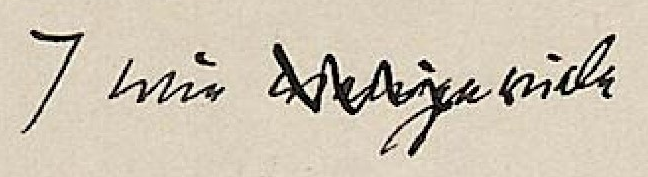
wie wenige viele
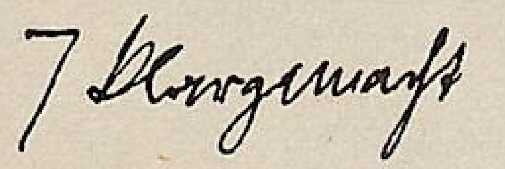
klargemacht
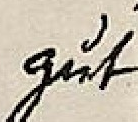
gut
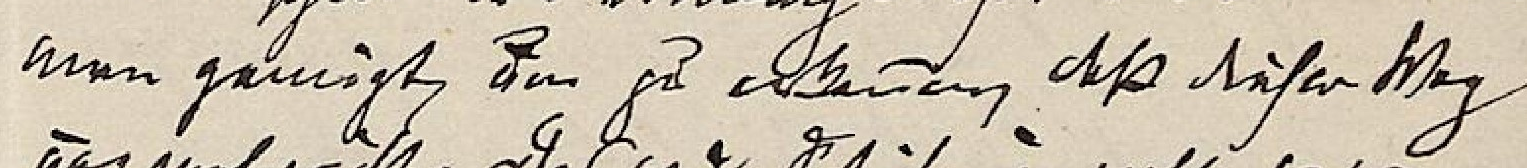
man geneigt, um zu erkenen, daß dieser Weg
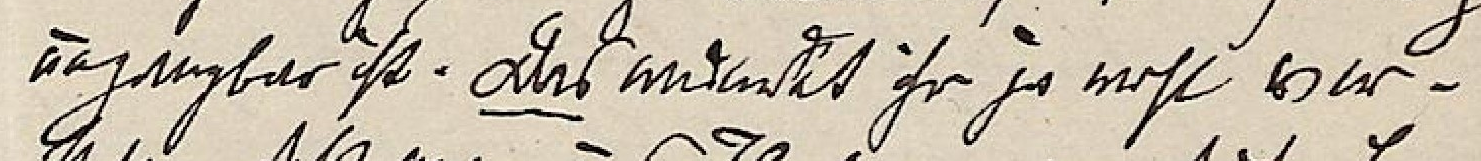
ungangbar ist. Das werdet ihr ja wohl ver¬
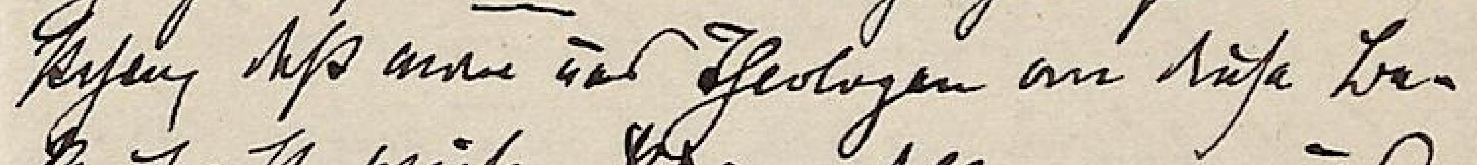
stehen, das man uns Theologen an diese Be¬
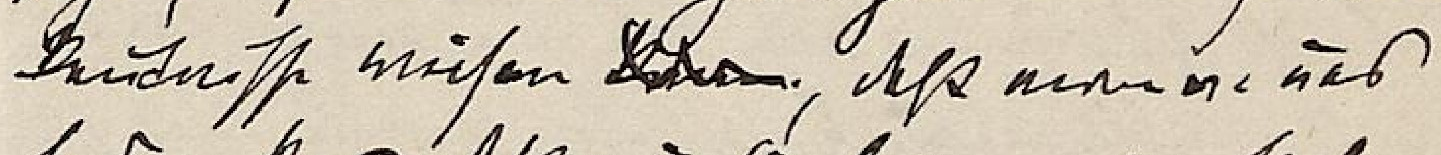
kentnisse weisen kann, daß man v. uns
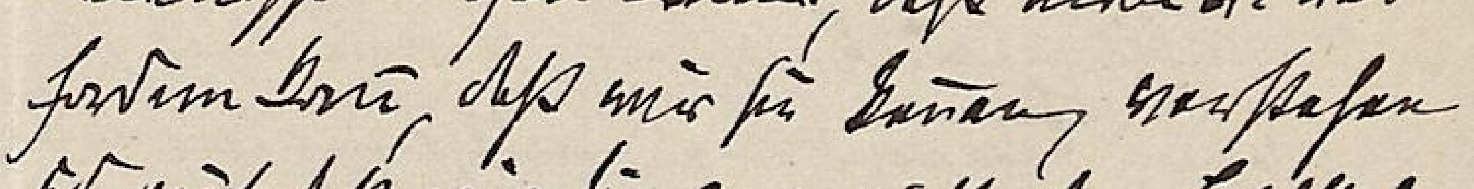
fordern kan, daß wir sie kenen, verstehen
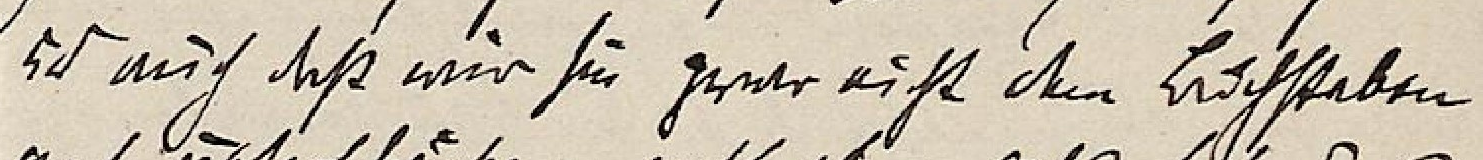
und auch daß wir sie zwar nicht dem Buchstaben
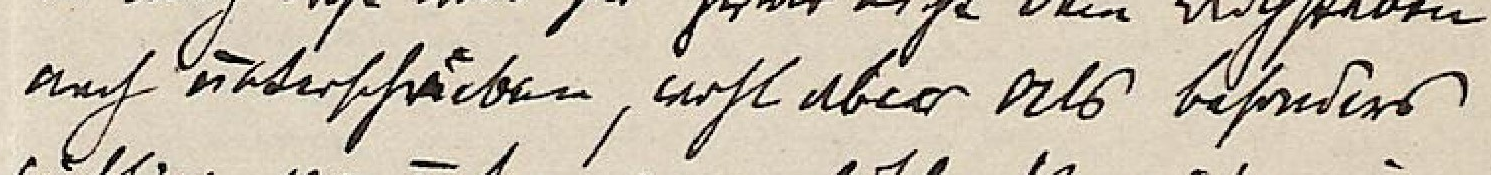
nach unterschrieben, wohl aber als besonders
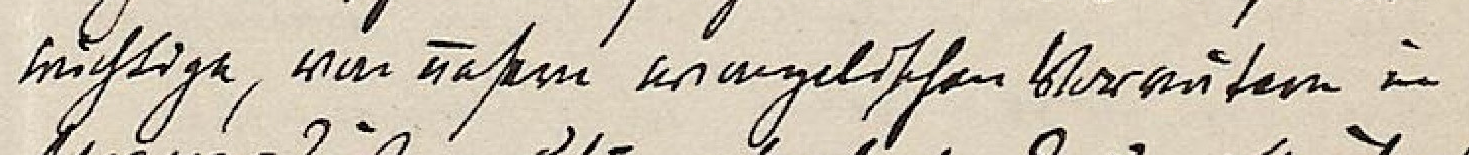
wichtige, vom unsern evangelischen Vorvätern in
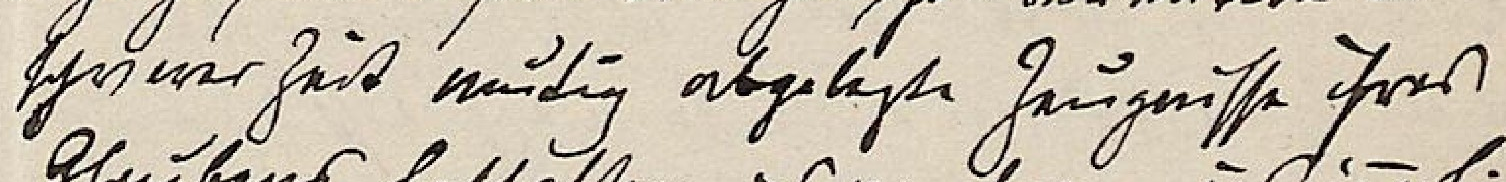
schwerer Zeit mutig abgelegte Zeugnisse ihres
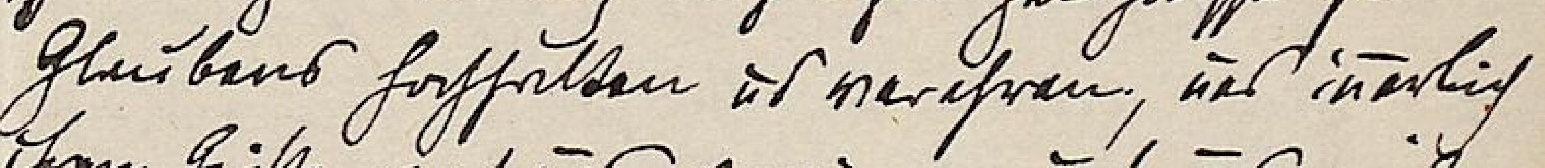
Glaubens hochhalten und verehren uns innerlich
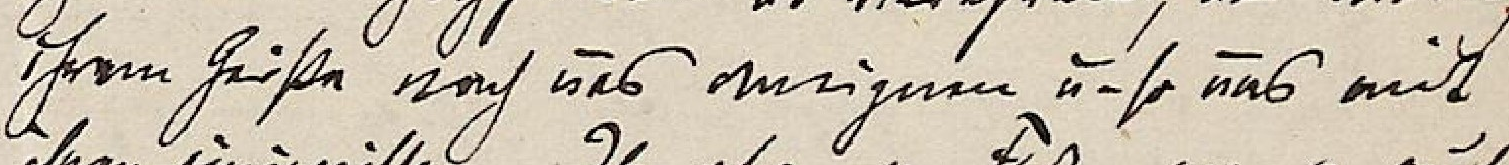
ihrem Geiste nach uns aneignen u. so uns mit
